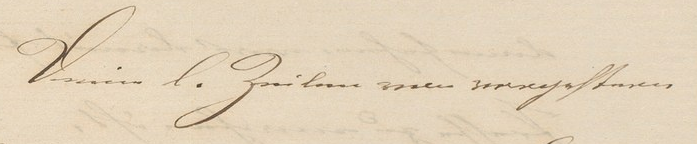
Deine l. Zeilen von vorgestern
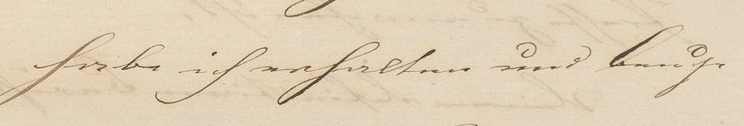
habe ich erhalten und beuge
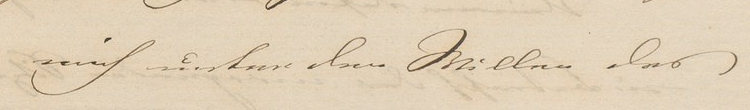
mich unter den Willen des
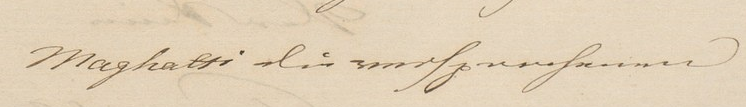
Maghatti die versprochenen
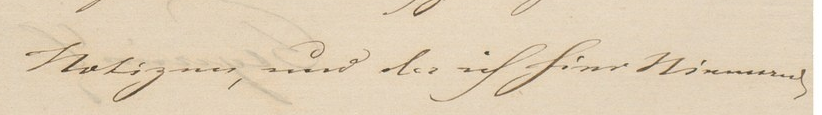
Notizen, und da ich hier Niemand
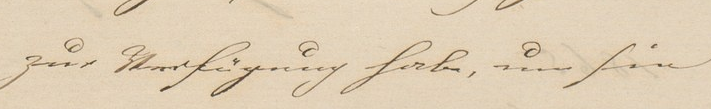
zur Verfügung habe, um sie
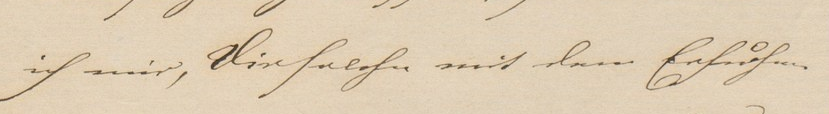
ich mir, Dir solche mit dem Ersuchen
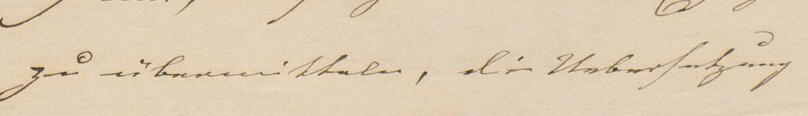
zu übermitteln, die Uebersetzung
